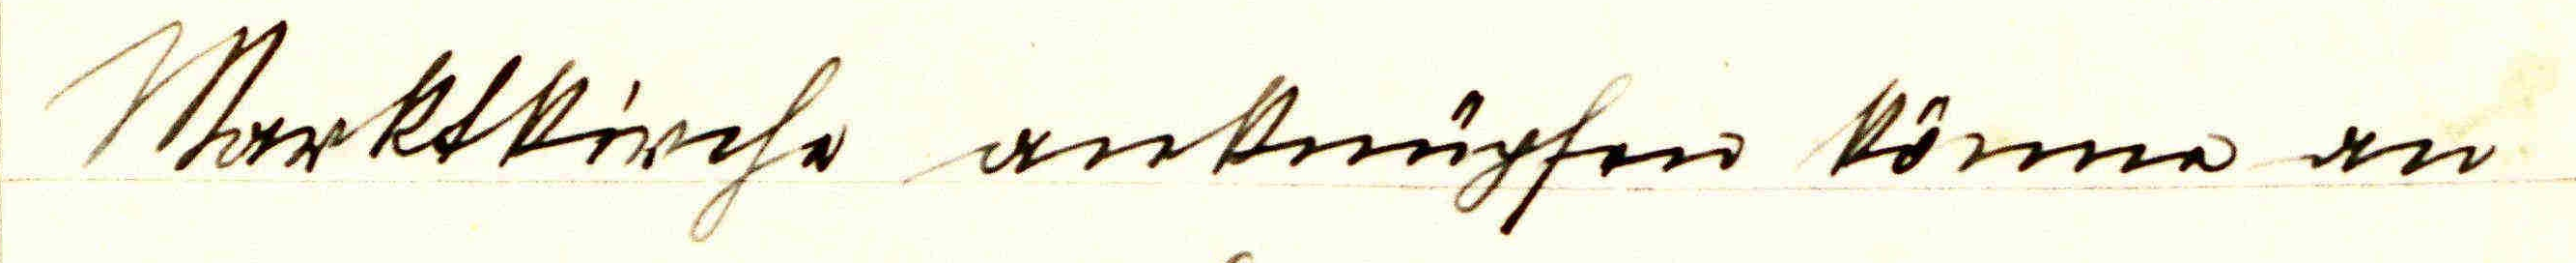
Marktkirche anknüpfen könne an
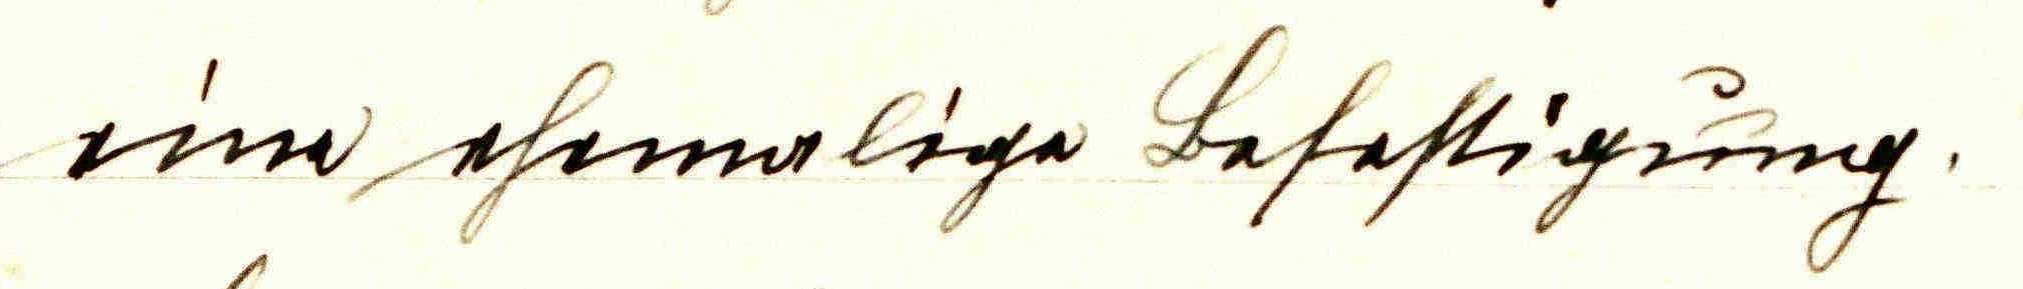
eine ehemallige Befestigung.
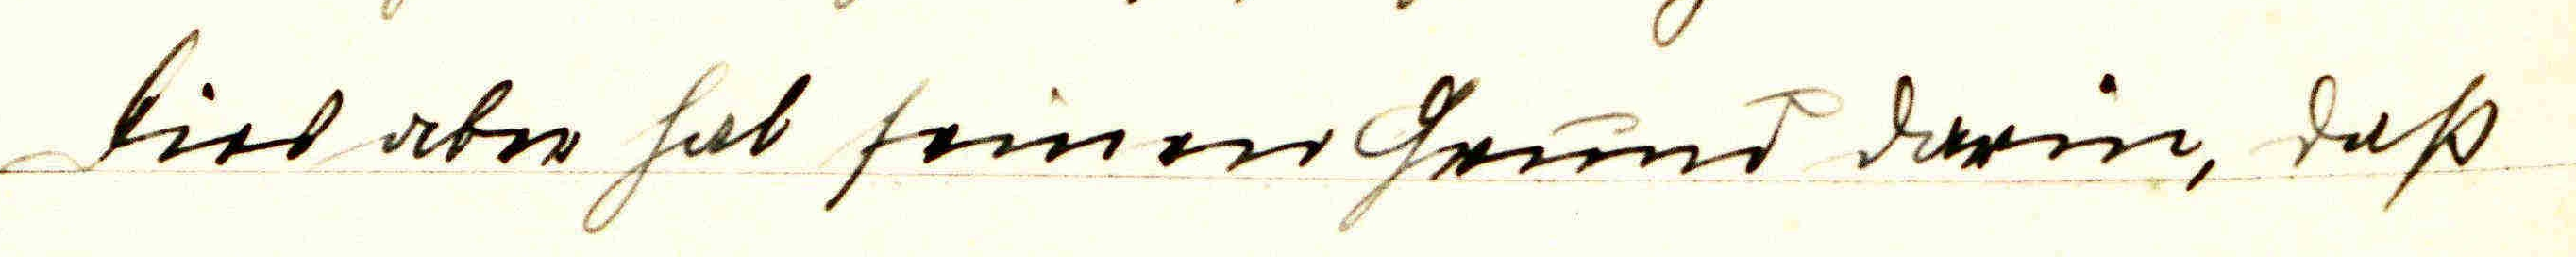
Dies aber hat seinen Grund darin, daß
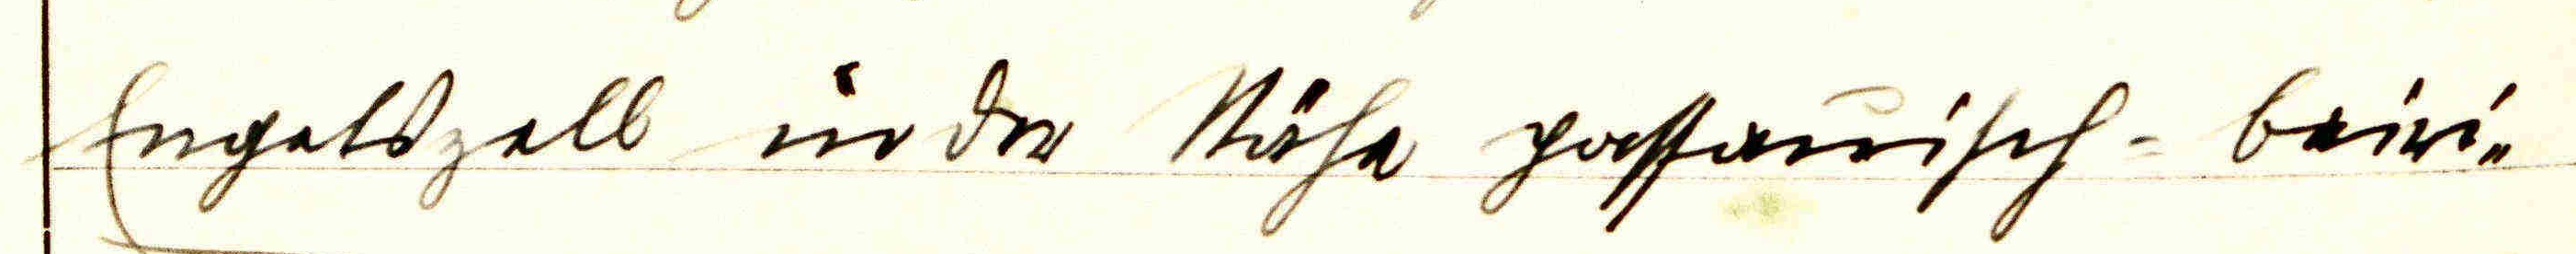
Engelszell in der Nähe passauisch-bairi-
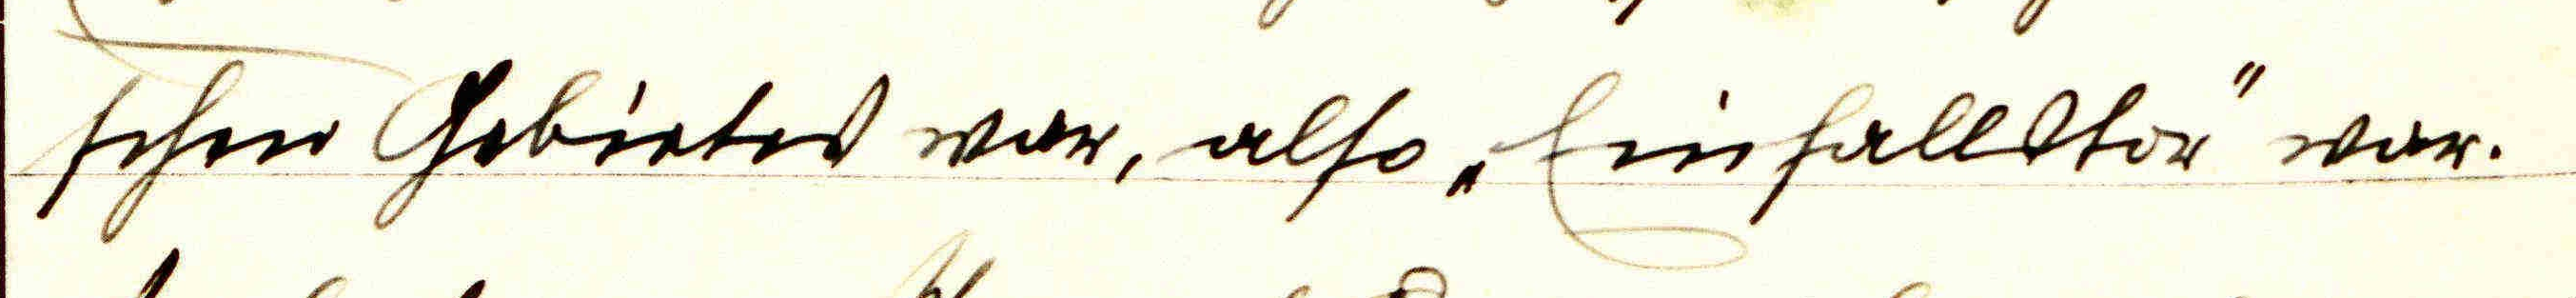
schen Gebietes war, also „Einfallstor“ war.
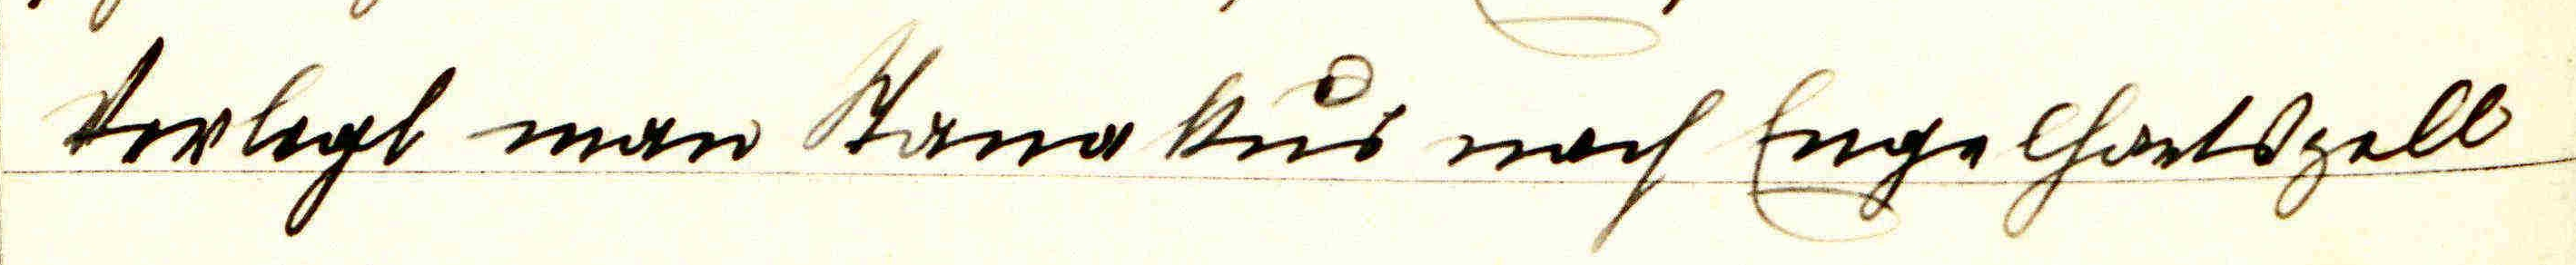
Verlegt man Stanakus nach Engelhartszell
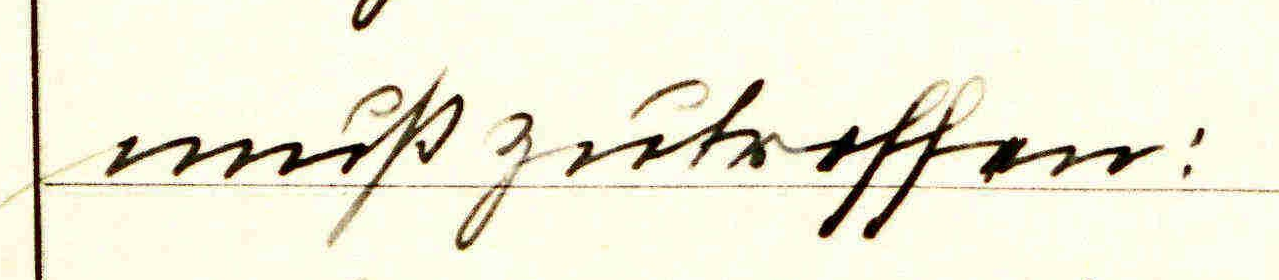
muß zutreffen:
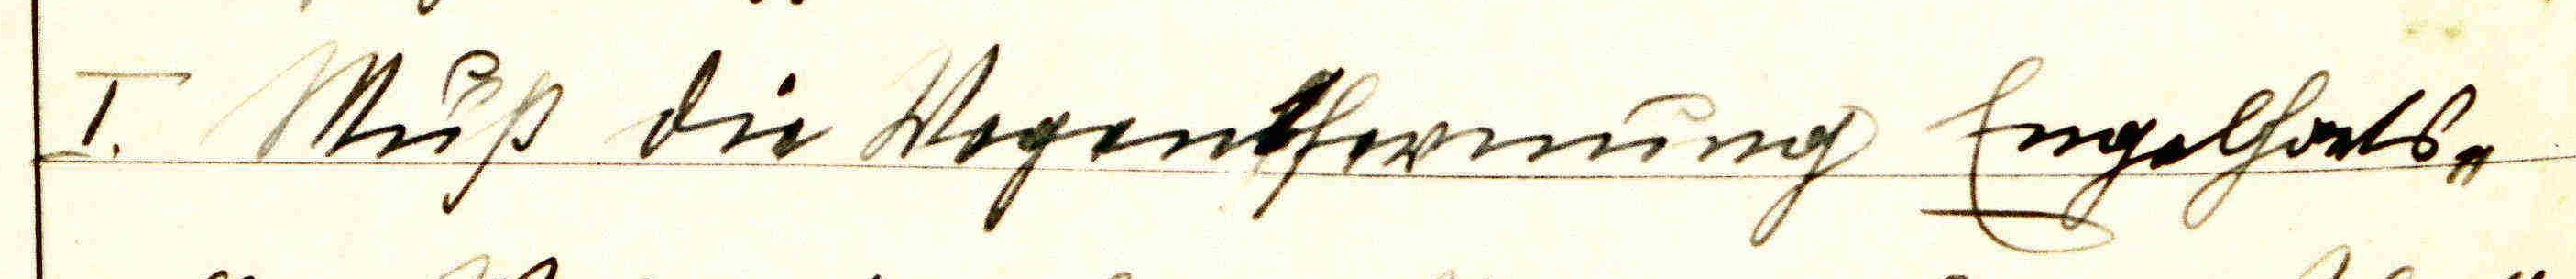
I. Muß die Wegentfernung Engelharts-
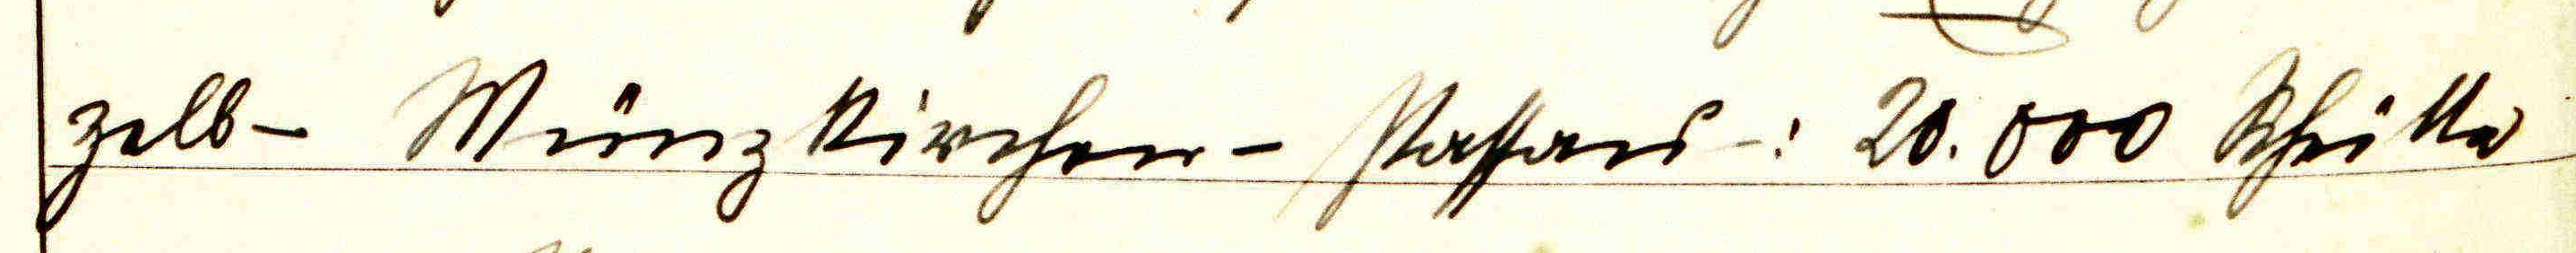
zell-Münzkirchen-Passau: 20.000 Schritte
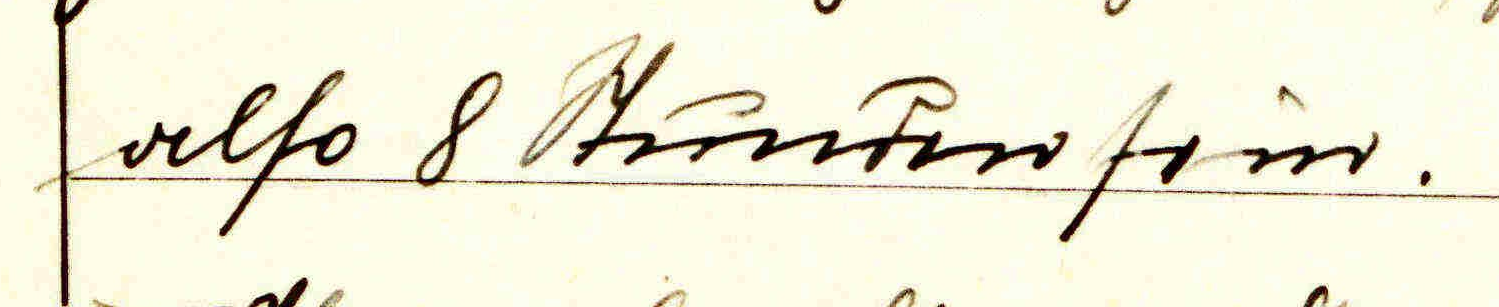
also 8 Stunden sein.
